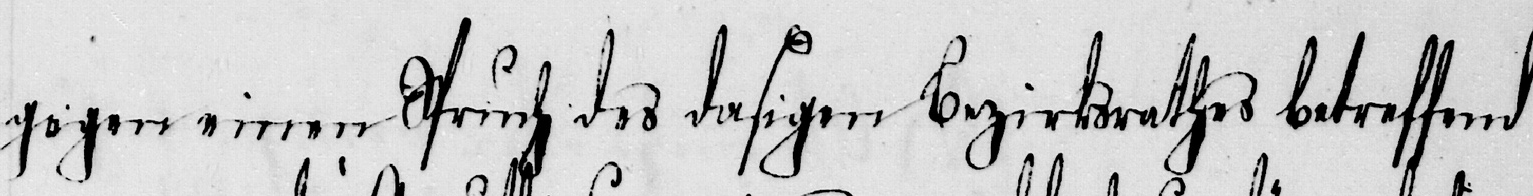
gegen einen Spruch des dasigen Bezirksrathes betreffend
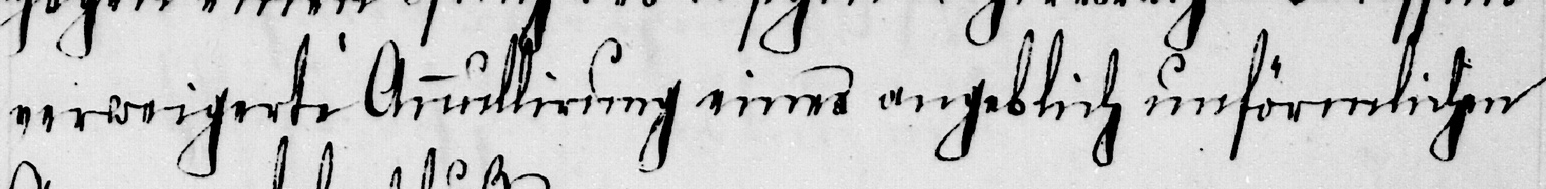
verweigerte Annullierung eines angeblich unförmlichen
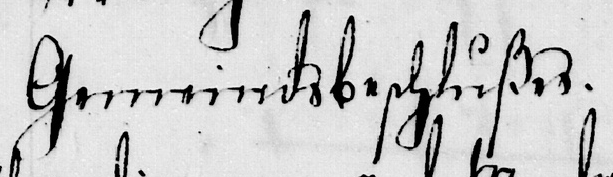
Gemeindebeschlußes.
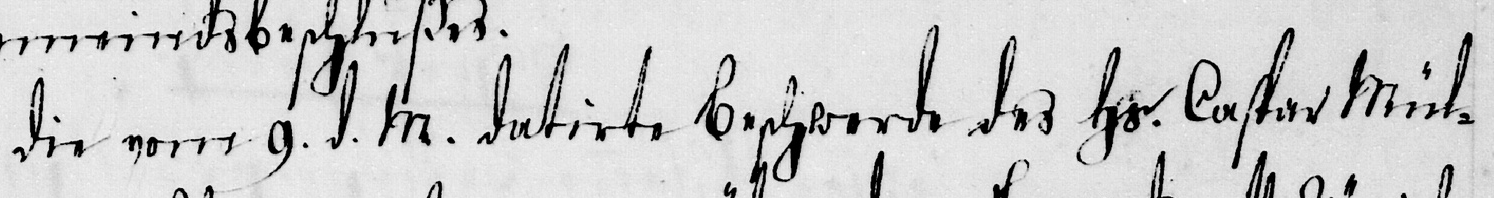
die vom 9. d. M. datirte Beschwerde des Hs. Caspar Mül¬
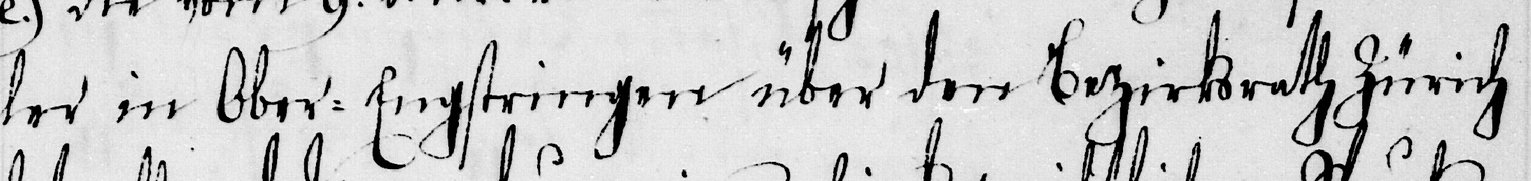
ler in Ober-Engstringen über den Bezirksrath Zürich
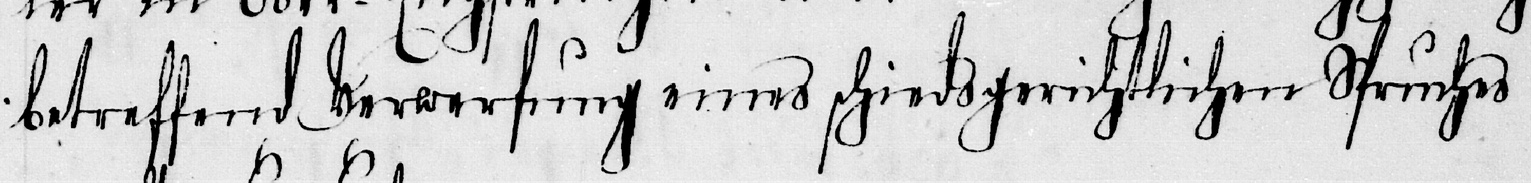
betreffend Verwerfung eines schiedsrichtlichen Spruches
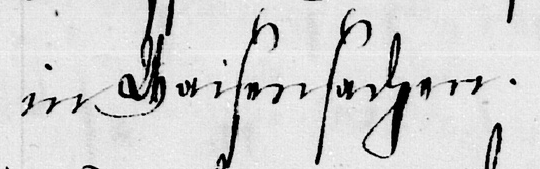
in Waisensachen.
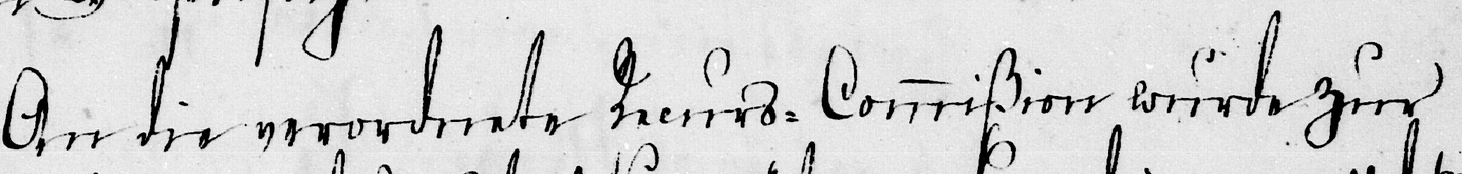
An die verordnete Recurs-Commißion wurde zur
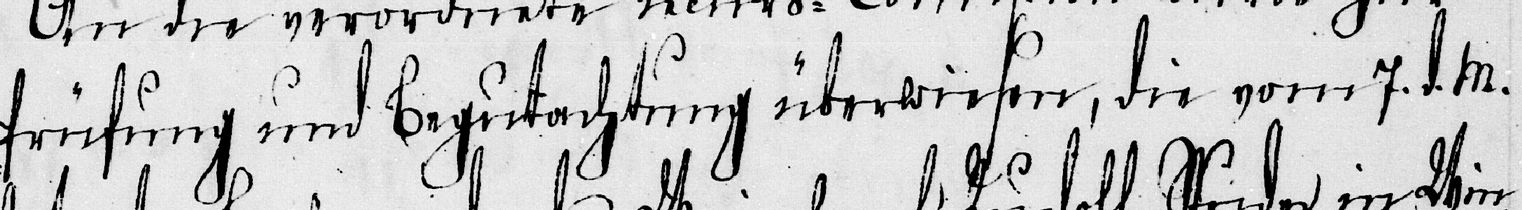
Prüfung und Begutachtung überwiesen, die vom 7. d. M.
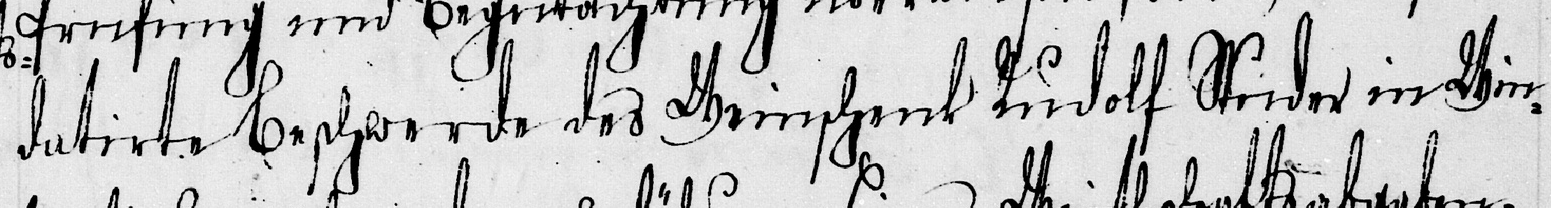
datirte Beschwerde des Weinschenk Rudolf Studer in Win¬
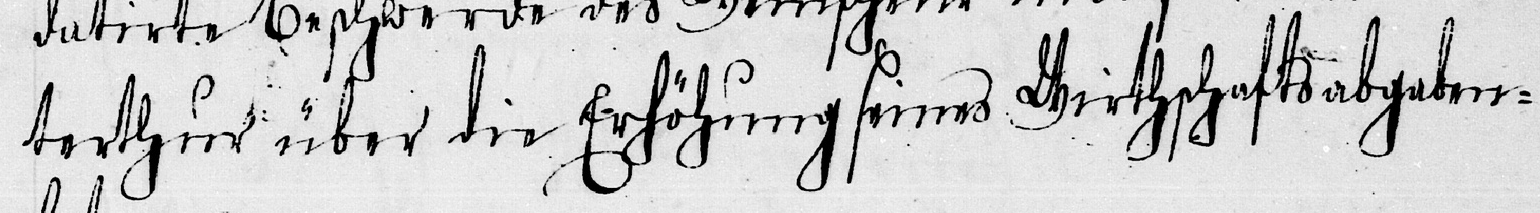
terthur über die Erhöhung seines Wirtschaftsabgaben¬
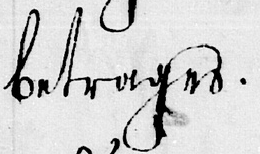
betrages.
